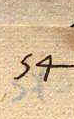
54
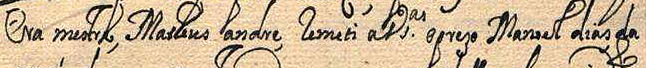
Era mestre, Matheus andre, Remeti a V s.as o prezo Manoel dias da
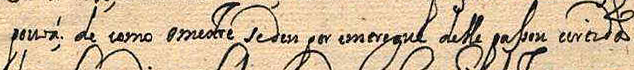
pouoa; de como o mestre se deu por emtregue delle passou certidaõ
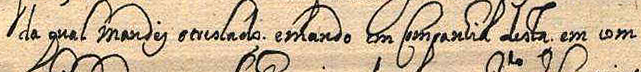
da qual mandej o treslado; e mando em Companhia desta em com
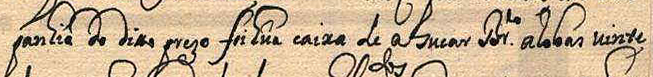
panhia do ditto prezo foi hūa caixa de asucar Br.co aRobas uinte,
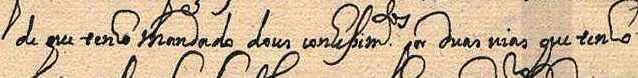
de que tenho mandado dous conhessim.tos por duas uias que tenho
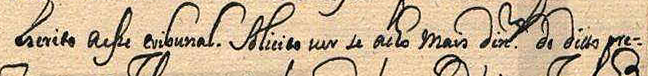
escrito a esse tribunal. Solicito uer se acho mais din.ro do ditto pre
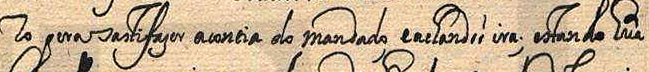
zo pera satisfazer a contia do mandado, e achandoo ira; estando hūa
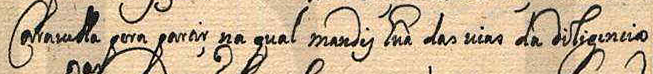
Carauella pera partir, na qual mandej hūa das uias da deligencia
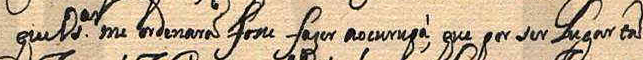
que Vs.as me ordenaraõ fosse fazer ao curupà, que por ser Lugar tā
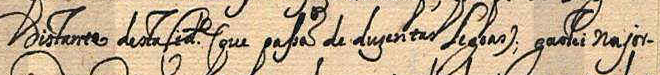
distante desta Cid.e (que passa de duzentas Legoas); gastei na jor
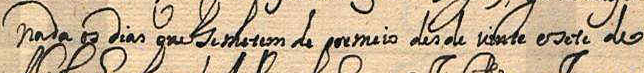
nada os dias que se metem de permeio desde uinte e sete de
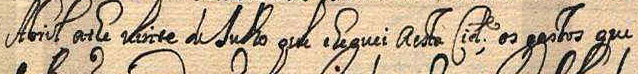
Abril, athe uinte de Iulho, que cheguei a esta Cid.e; os gastos que
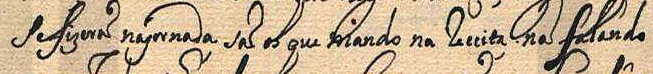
se fizeraõ na jornada, saõ os que mando na Receita; naõ falando
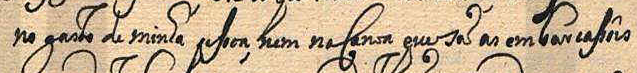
no gasto de minha pessoa, nem na Canoa que saõ as embarcassõis
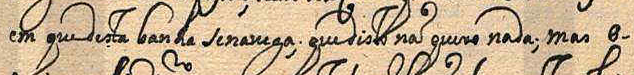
em que desta banda se nauega; que disto naõ quero nada; mas o
